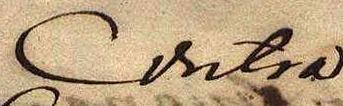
Contra
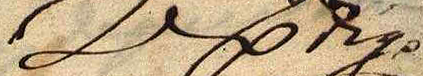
Lix.a digo
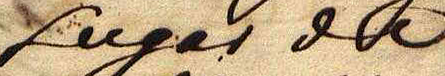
Lugar de
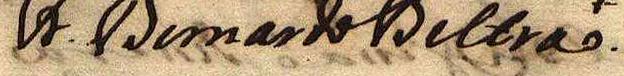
Fr. Bernardo Beltraõ.
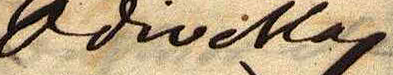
Odivellas
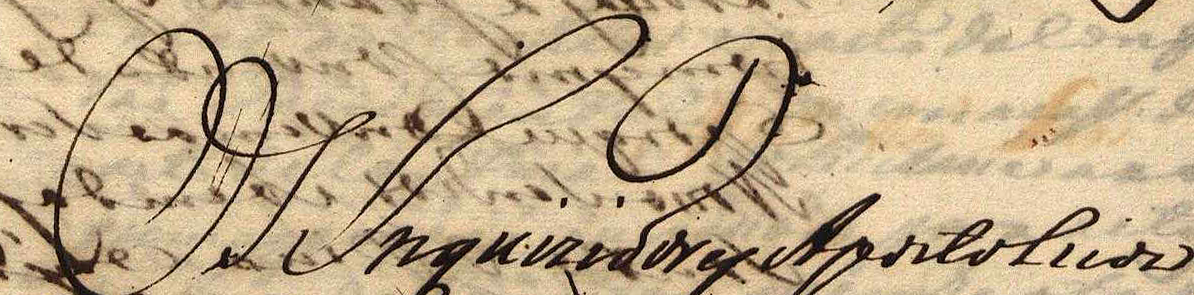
Os Inquizidores Apostolicos
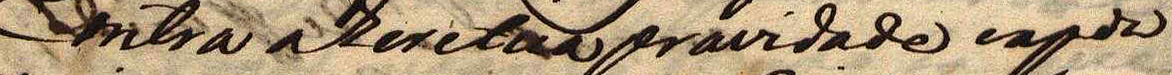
Contra a heretica pravidade e apos
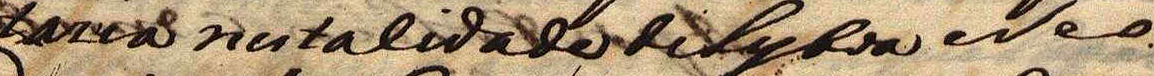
tazia nesta Cidade de Lisboa e seo
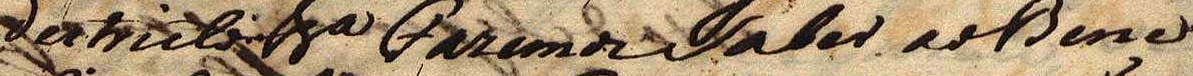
destricto &a Fazemos saber ao Bene
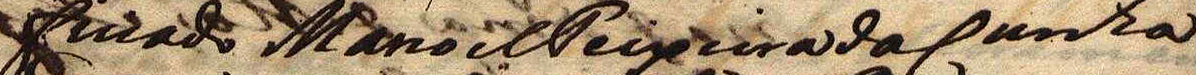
ficiado Manoel Teixeira da Cunha
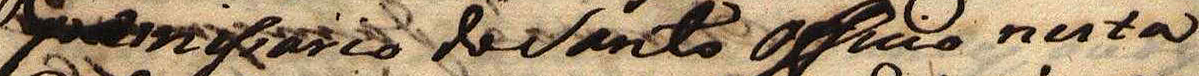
__nissario do santo officio nesta
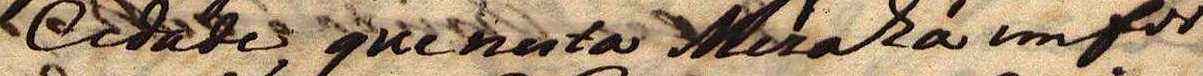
Cidade, que nesta Meza há imfor
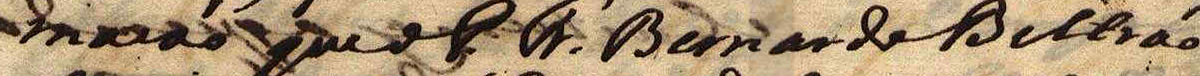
macão que o P. Fr. Bernardo Beltraõ
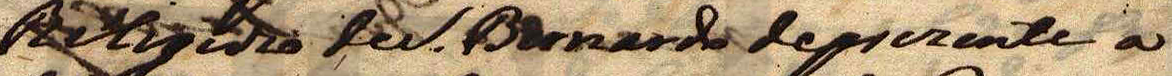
Religiozo de S. Bernardo de prezente a
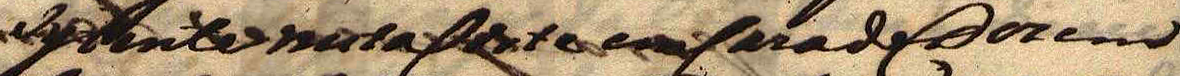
sistente nesta Corte em Caza do Dezem
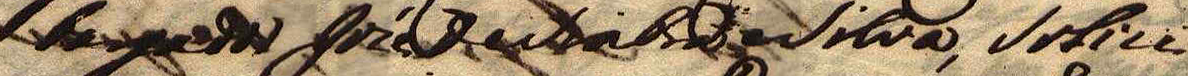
bargador Jozé de Sintra e Silva, solici
